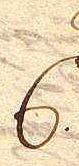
6.
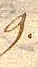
9.
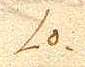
10.
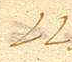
11.
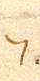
7.
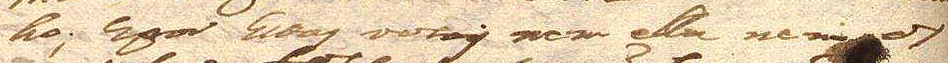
ho; E por Estas vezas nem ella nem os
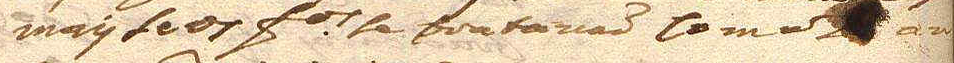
mais seos f.os se tratauaõ com ele an
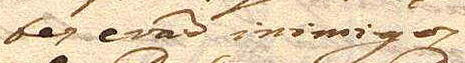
tes eraõ inimigos
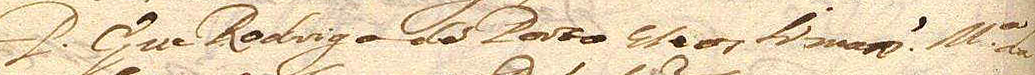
P. Que Rodrigo do Porto, e seos Irmaõs. M.a da
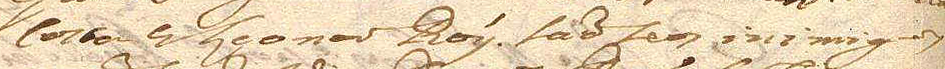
Costa E Leonor Roīs. saõ seos inimigos
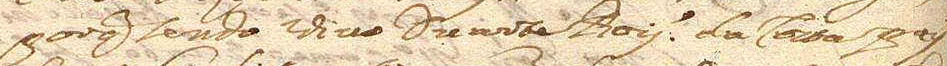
porq̄ sendo viuo Duarte Rois̄. da Costa pay
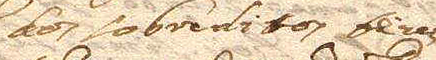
dos sobreditos teu
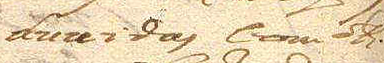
duuidas com o R.
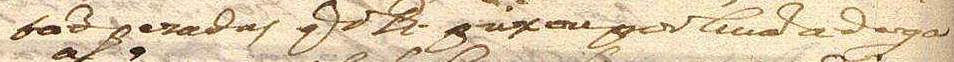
taõ pezadas q̄ o R. puxou por huā adaga
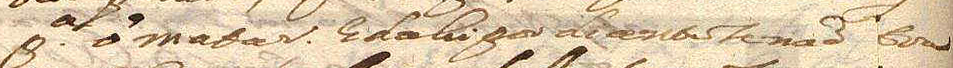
p.a o matar. E dali por diante se naõ tra
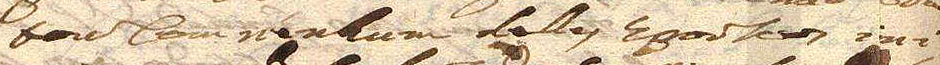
tou Com nenhum delles E por seos ini
